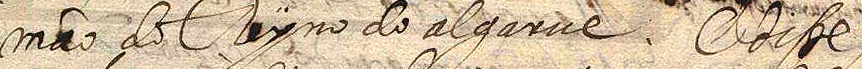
mão do Reyno do algarue. & disse,
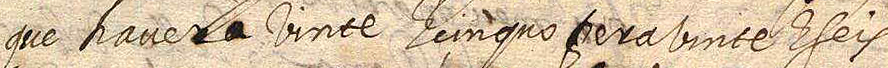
que hauerà vinte E çinquo pera vinte E seis
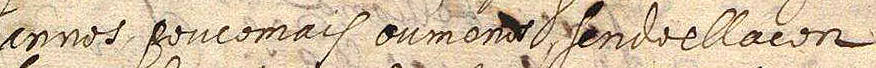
annos pouco mais ou menos, sendo ella con
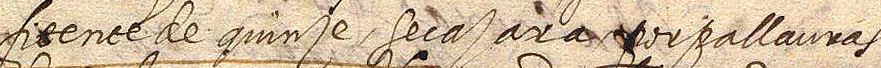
fitente de quinse, se casara, por pallauras
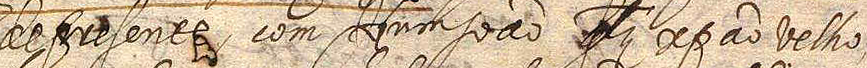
de presente, com Hum Joaõ ḡlz xpaõ velho,
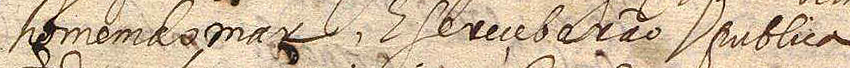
homem do mar, E se reçeberão publica
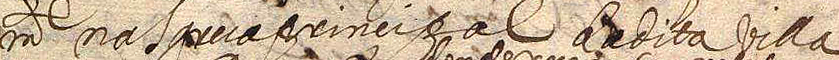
mte na Jgreia prinçipal da dita villa
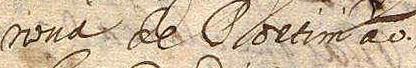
noua de Portimão.
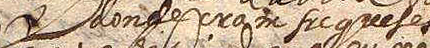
donde eram fregueses
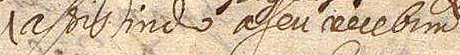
assistindo a seu recebimto
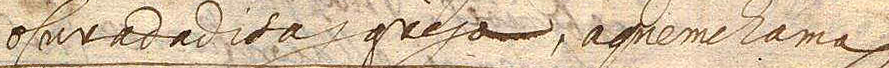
o Cura da dita jgreja, a quem chama
